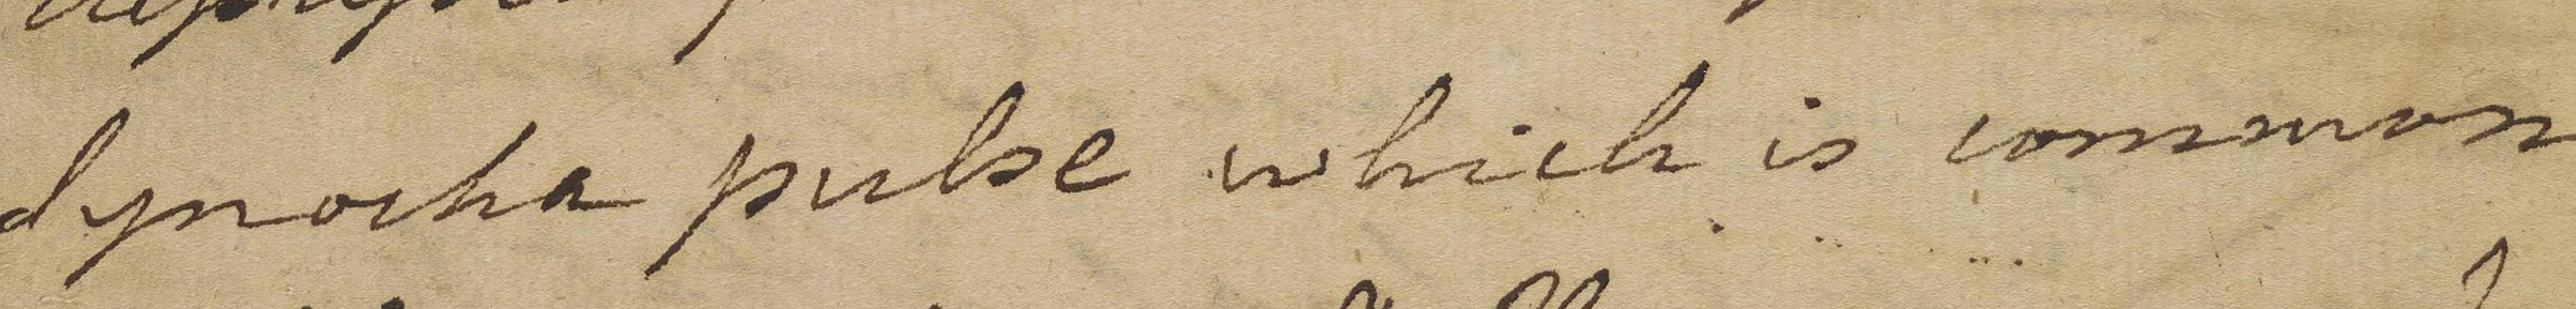Synocha pulse which is common
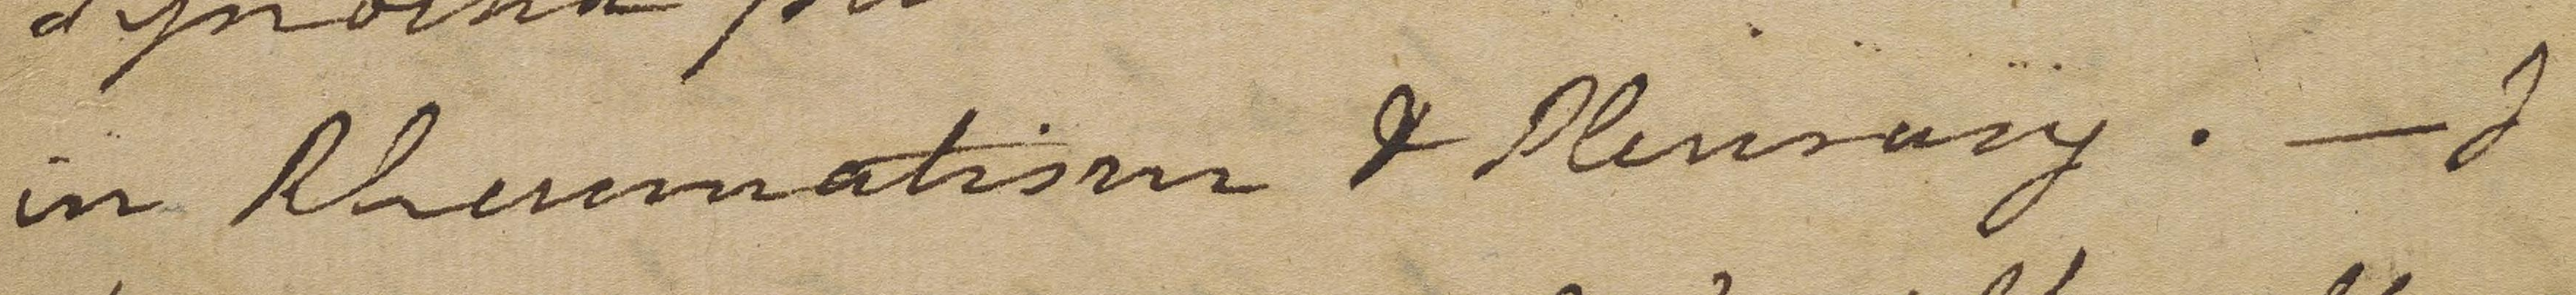in Rheumatism & Pleurasy. I
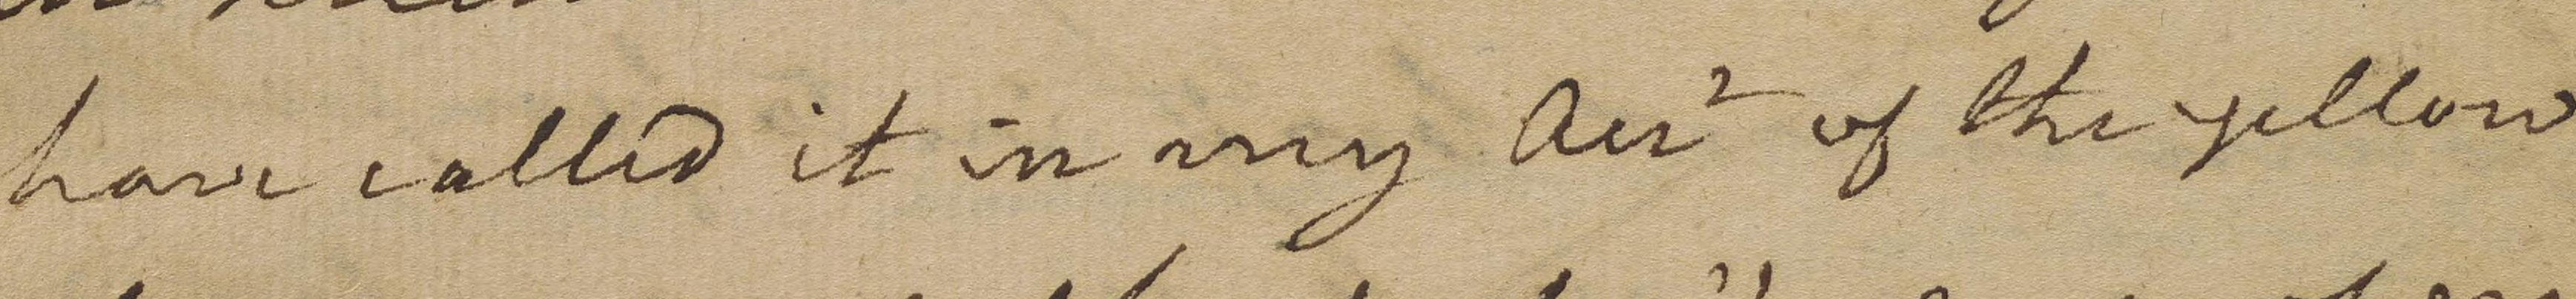have called it in my Air^2 of the yellow
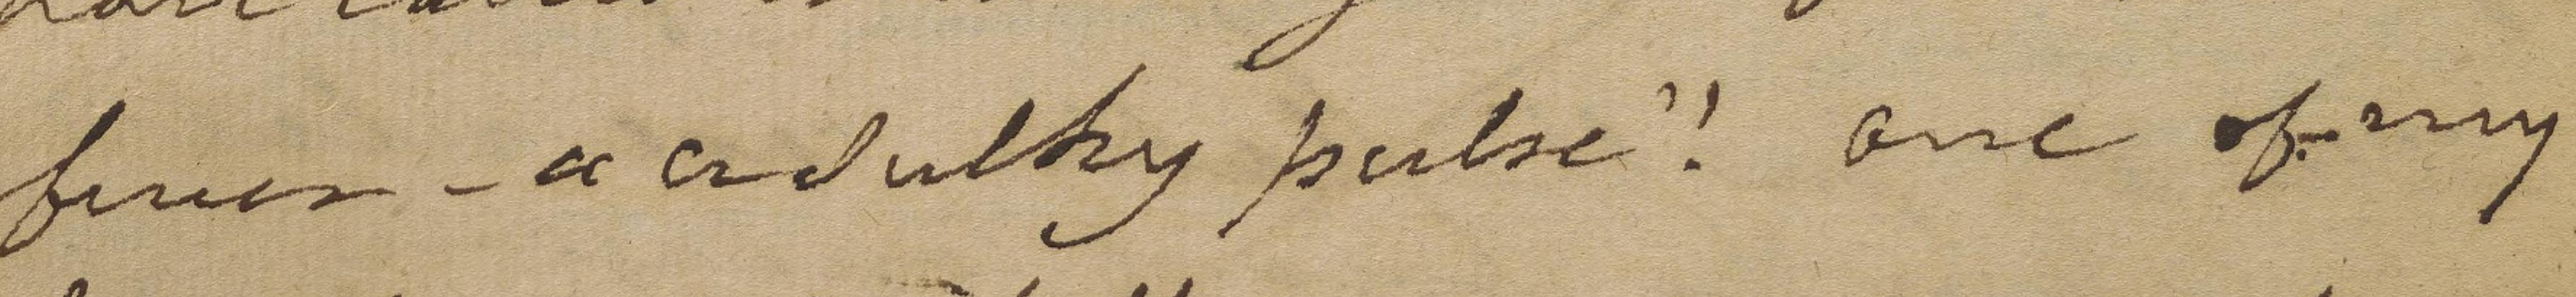fever, as a sulky pulse." one of my
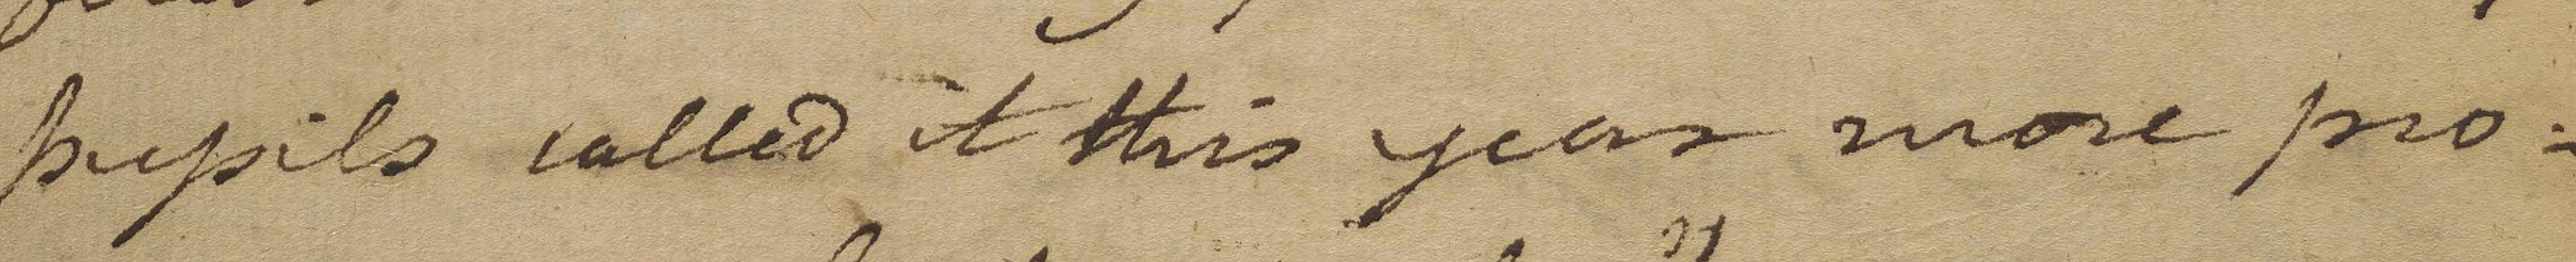pupils called it this year more pro-
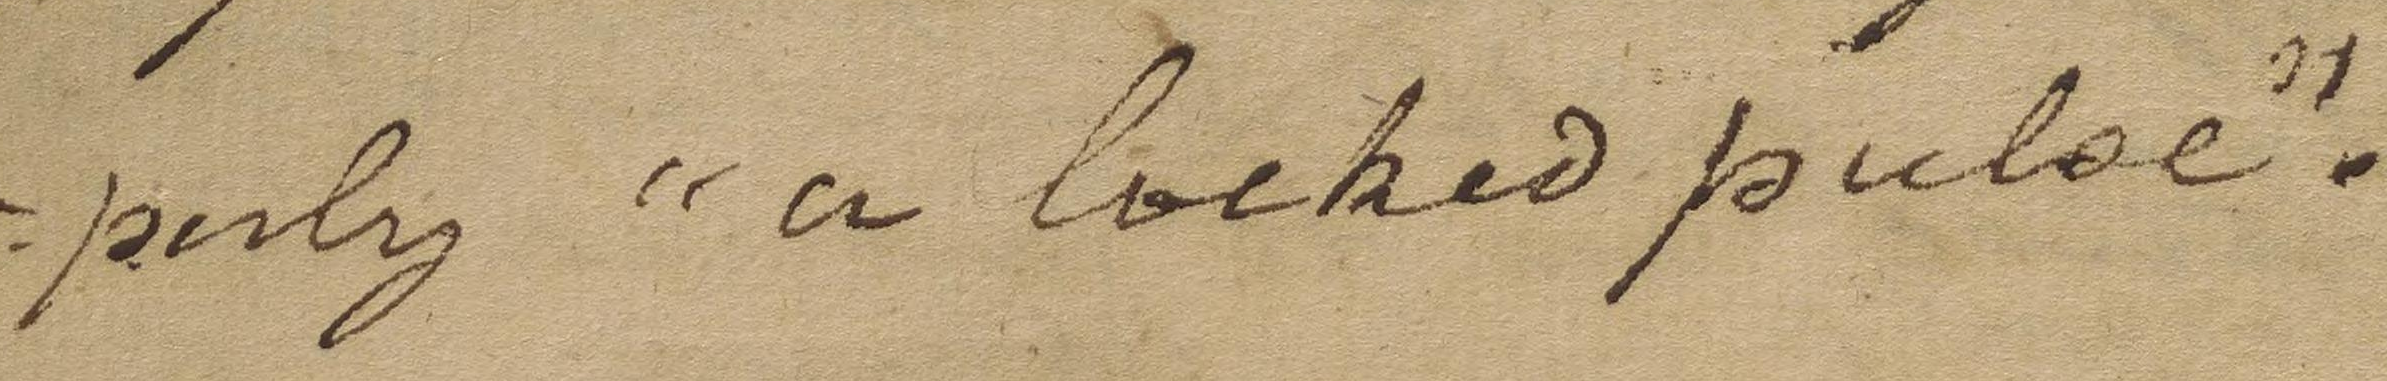-perly "a locked pulse."
